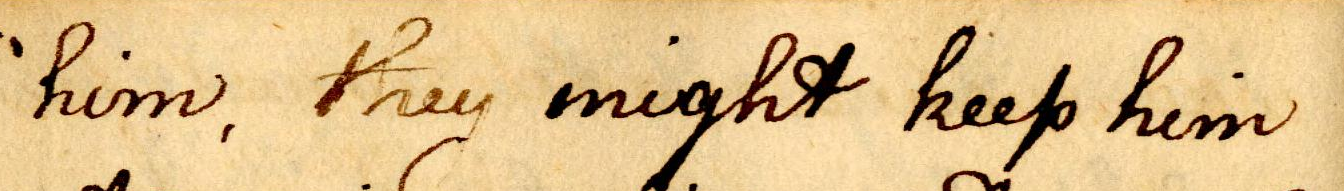him, they might keep him
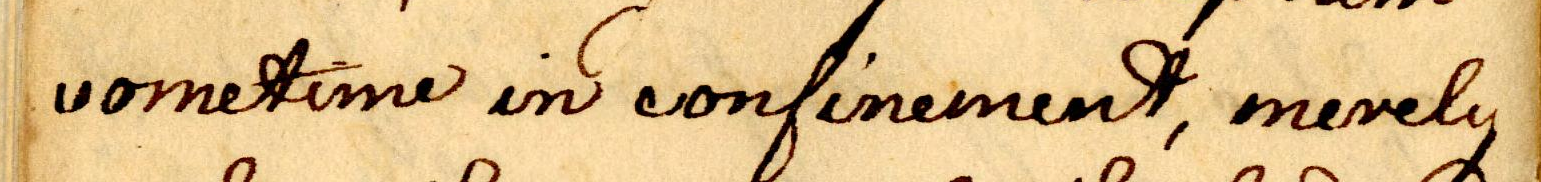sometimes in confinement, merely
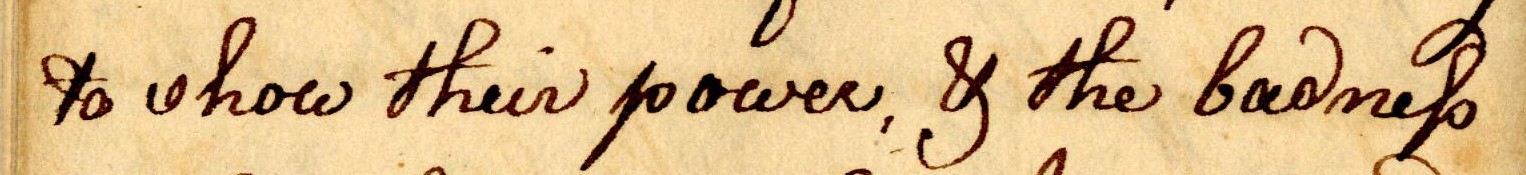to show their power, & the badness
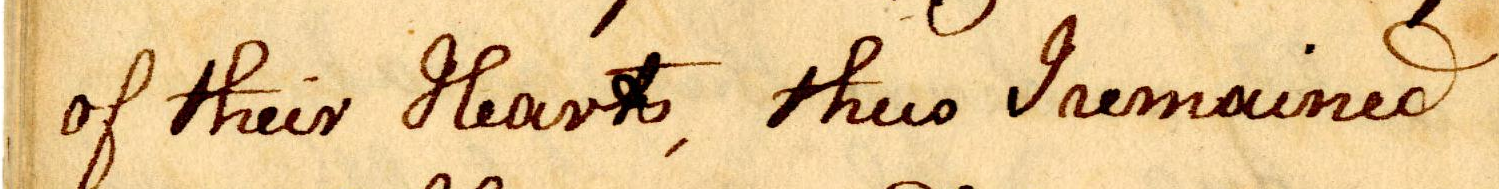of their Hearts, thus I remained
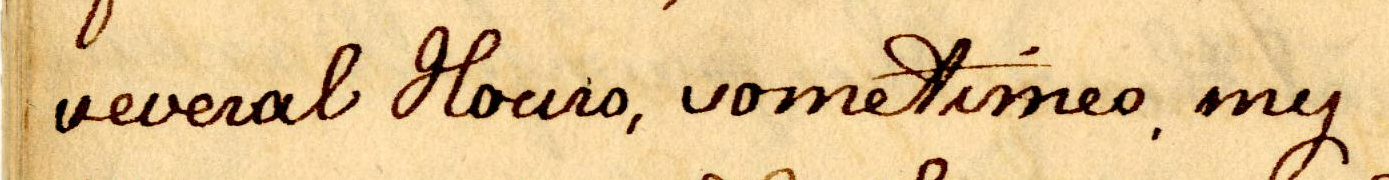several Hours, sometimes, my
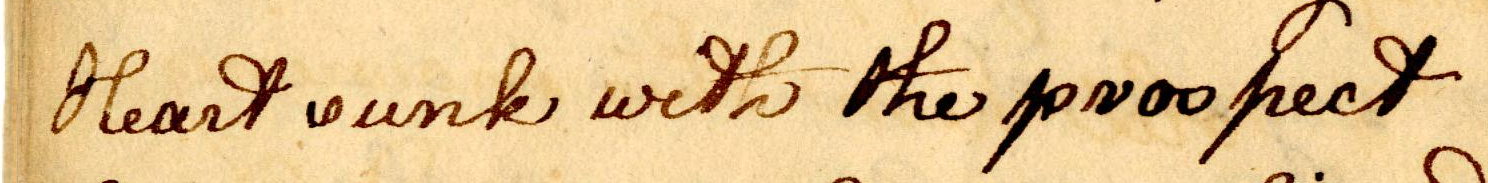Heart sunk with the prospect
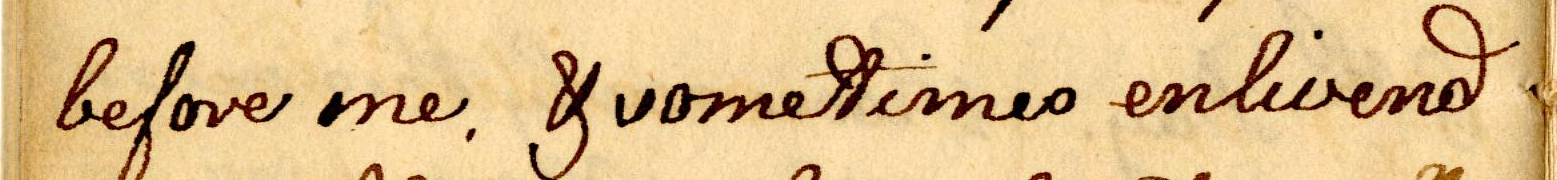before me. & sometimes enlivend
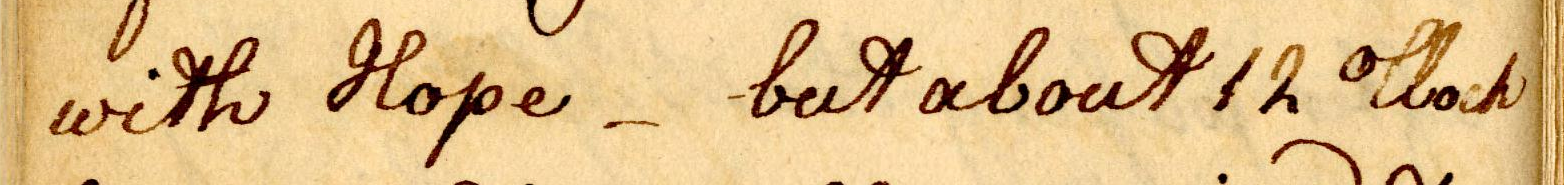with Hope- but about 12 ^oClock
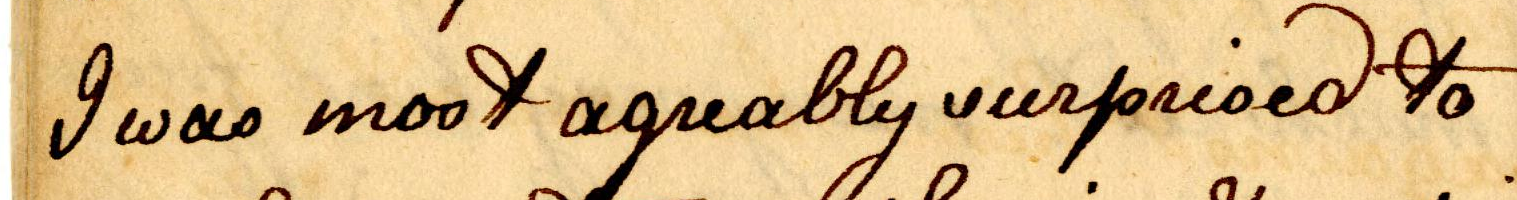I was most agreably surprised to
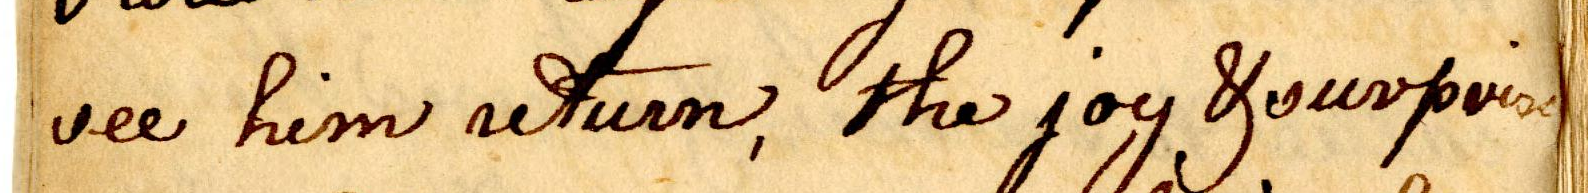see him return, the joy & surprise
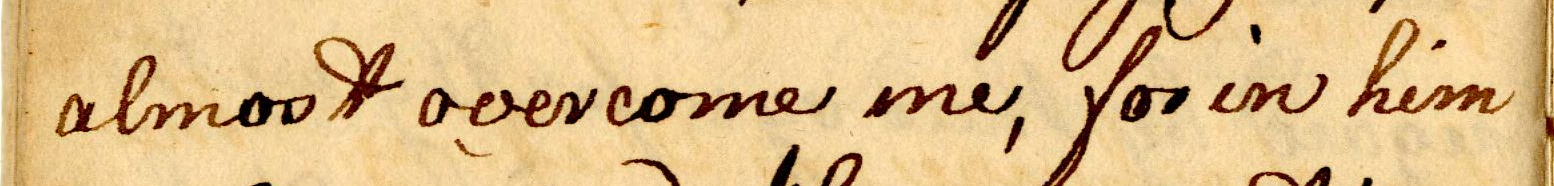almost overcome me, for in him
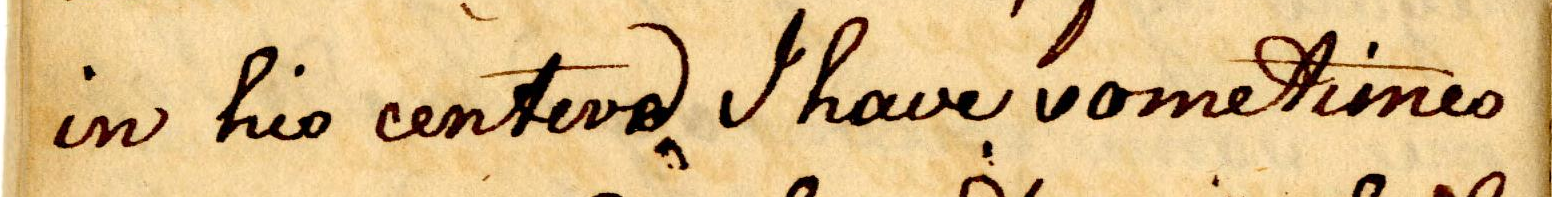in his centerd I have sometimes
